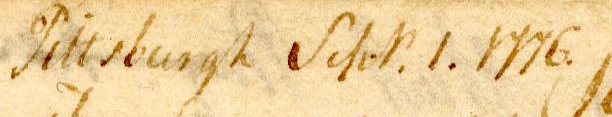Pittsburgh Sept^r. 1. 1776.
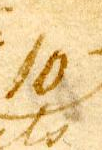10
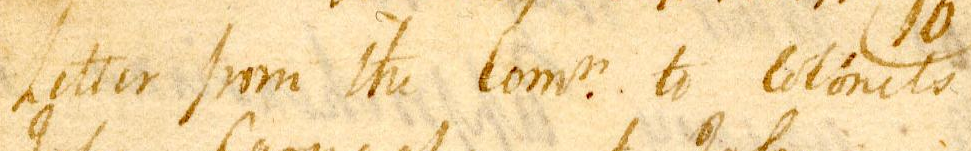Letter from the Com^r. to Colonels
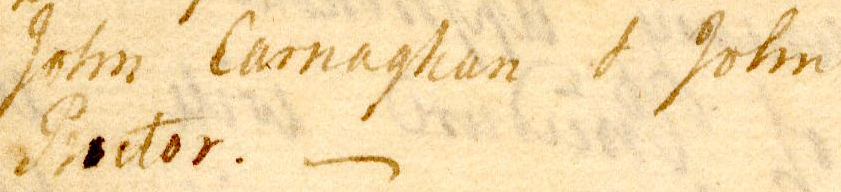John Carnaghan & John
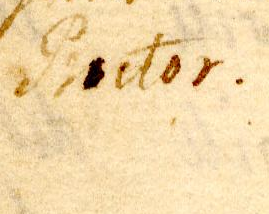Proctor.-
